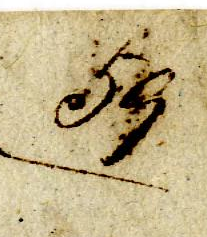59
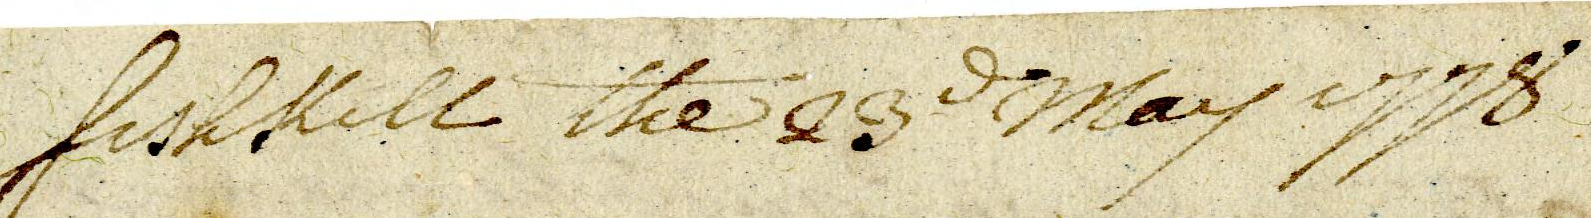fishkill the 23^d May 1778
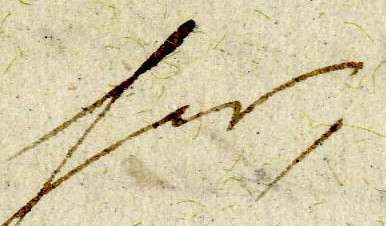Sir,
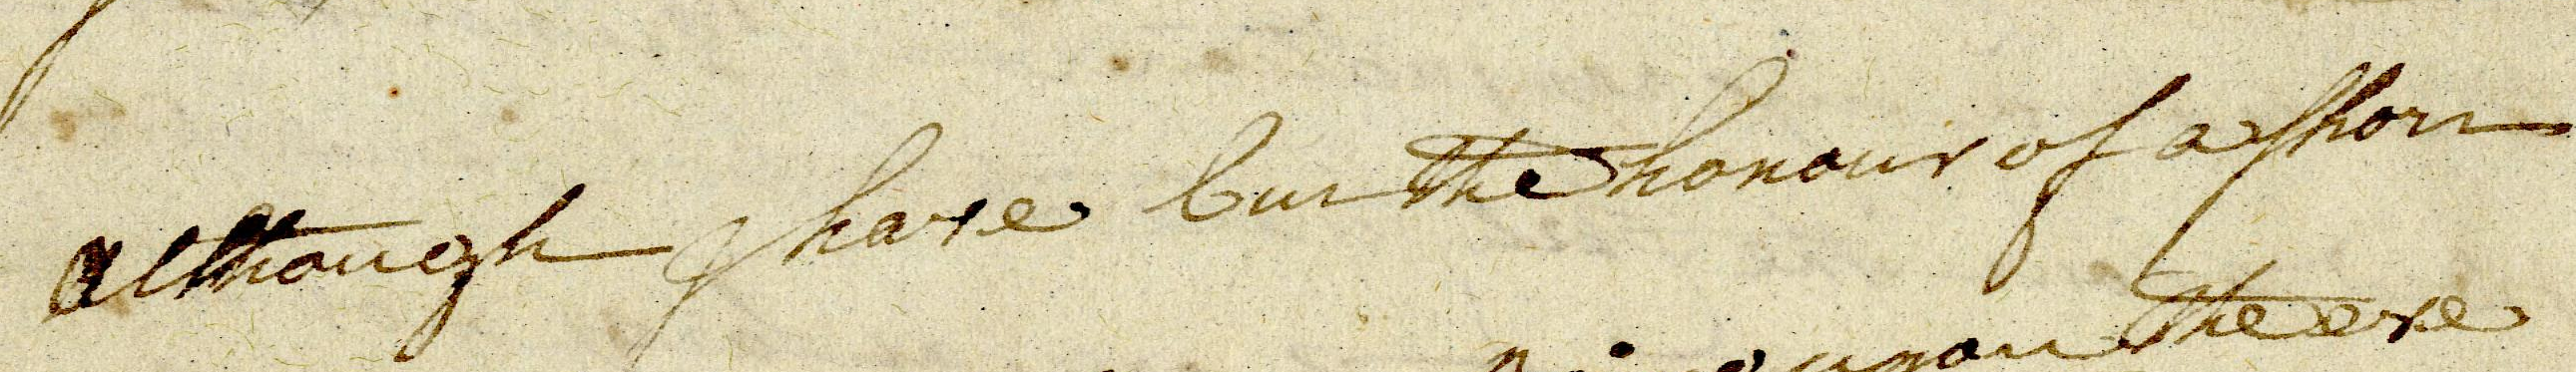Although I have but the honour of a short
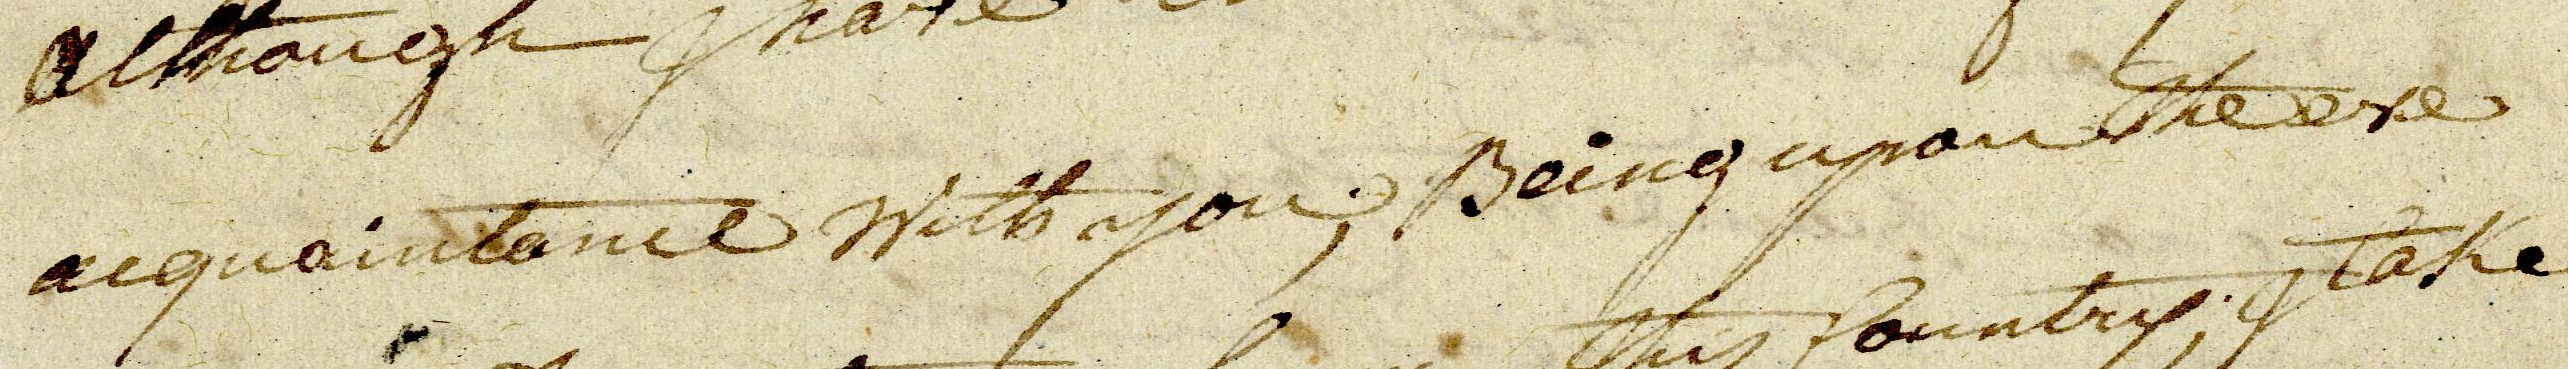acquaintance with you; Being upon the eve
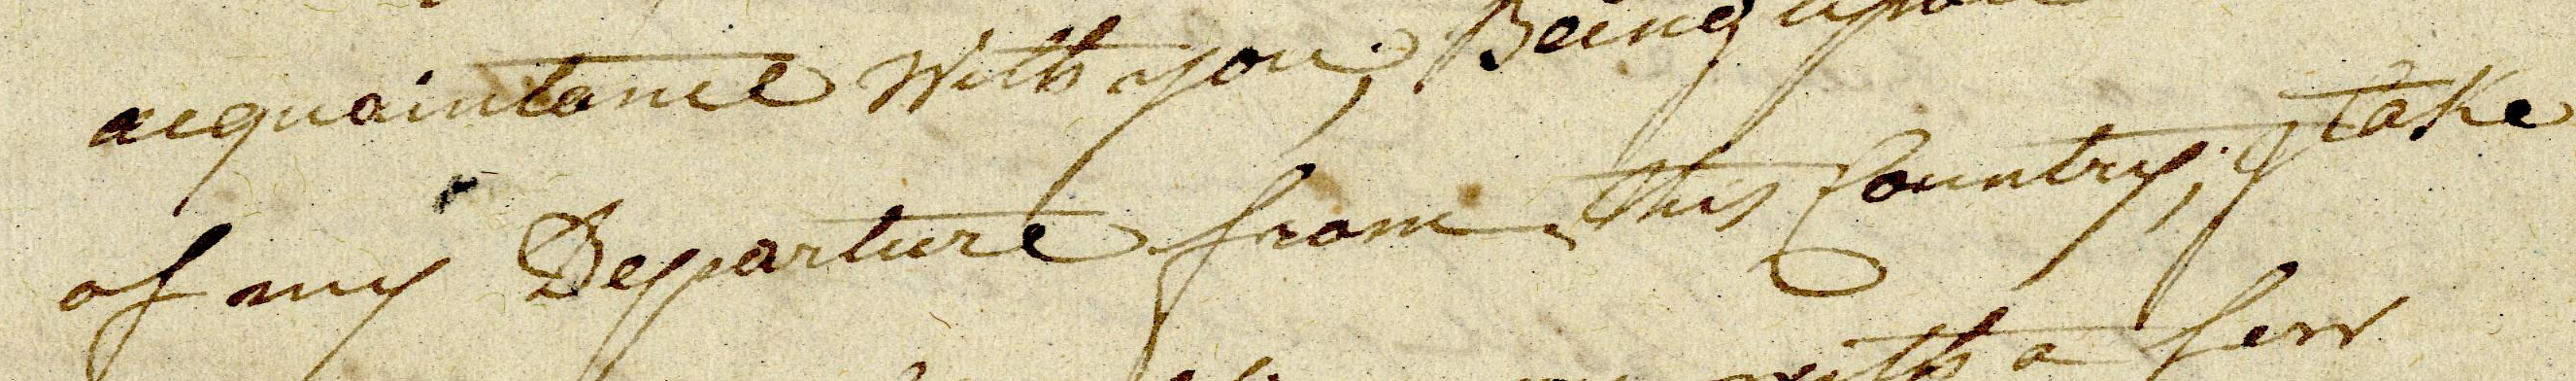of my Departure from this Country; I take
